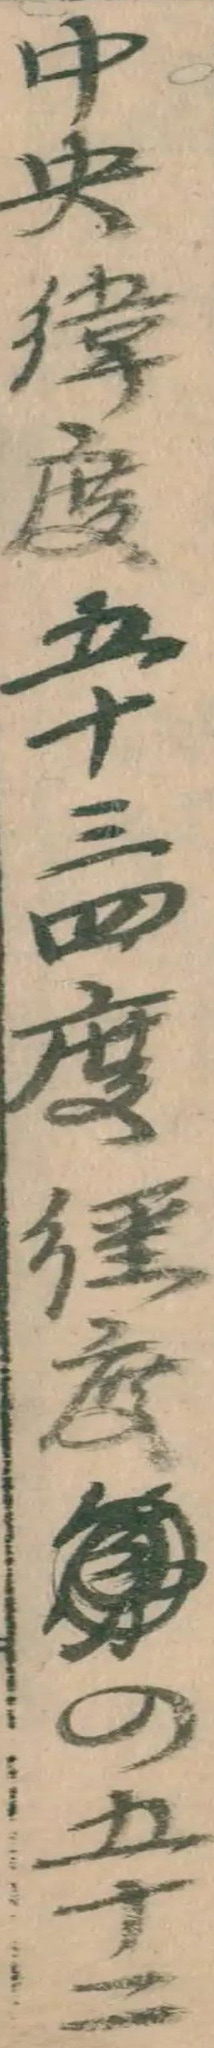中央緯度五十三四度経度の五十二

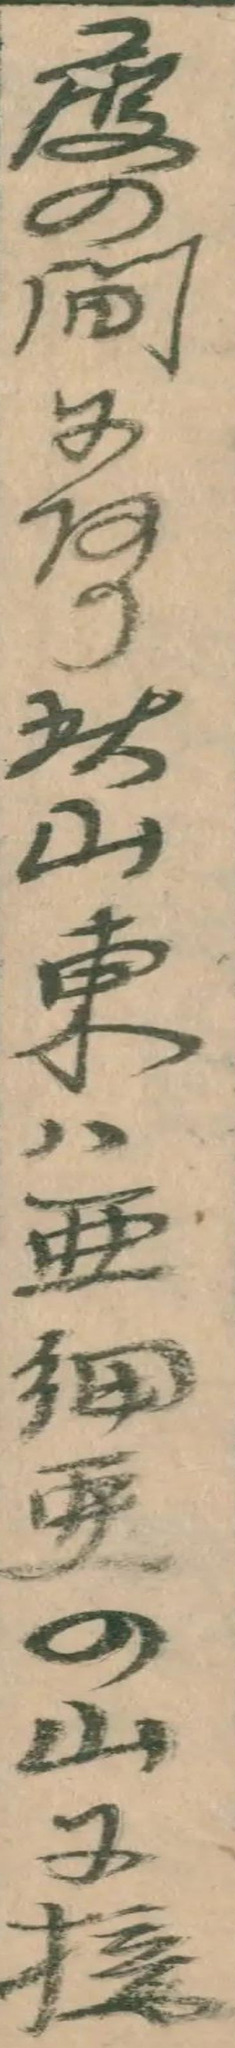度の間にあり此山東は亜細亜の山に接
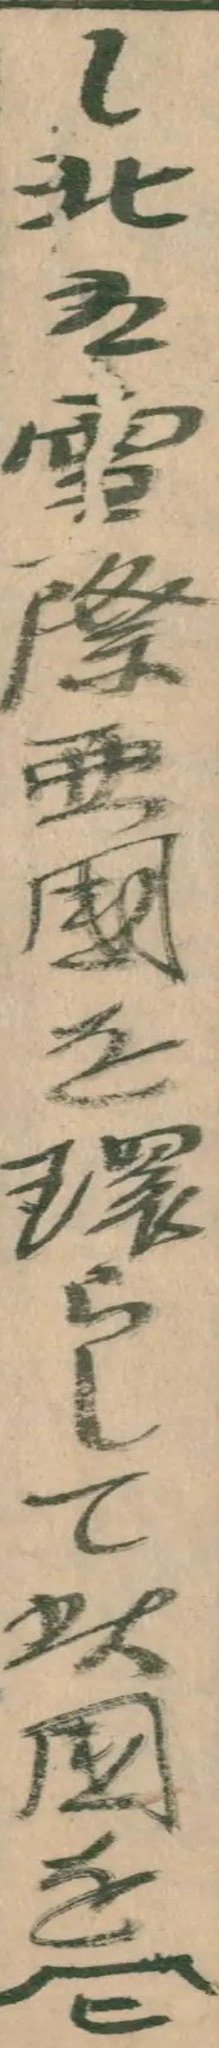し北は雪際亜国を環らして此国を(ヒ
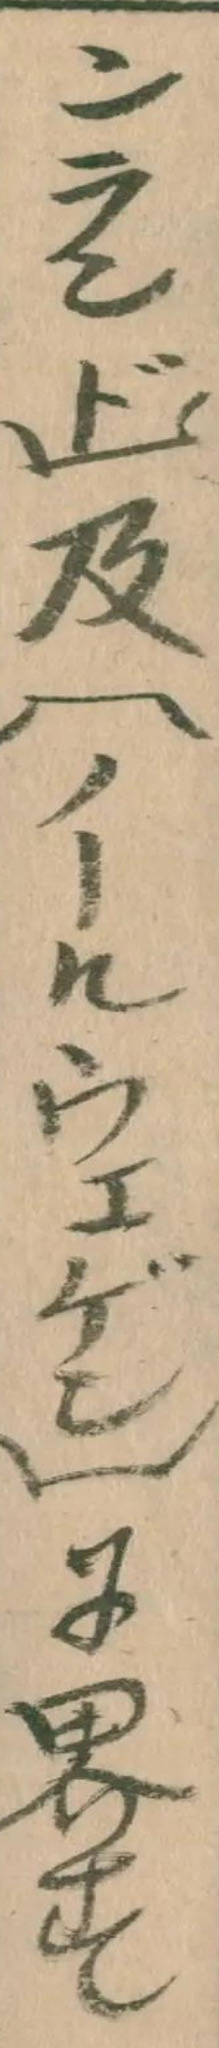ンランド)及(ノールウェゲン)に界す
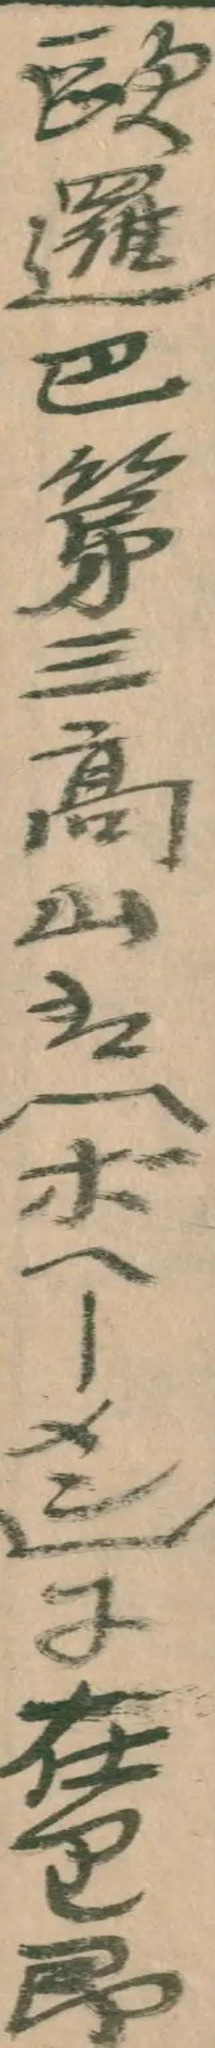欧邏巴第三高山は(ボヘーメン)に在り即
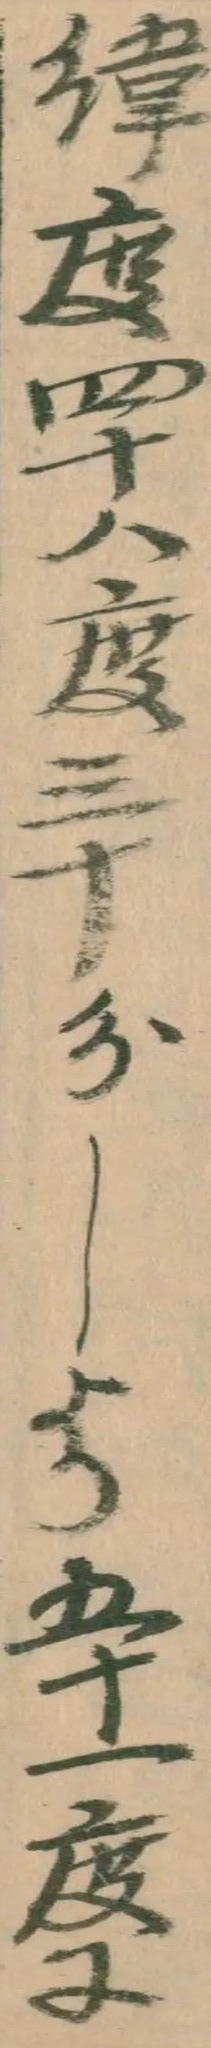緯度四十八度三十分―より五十一度に
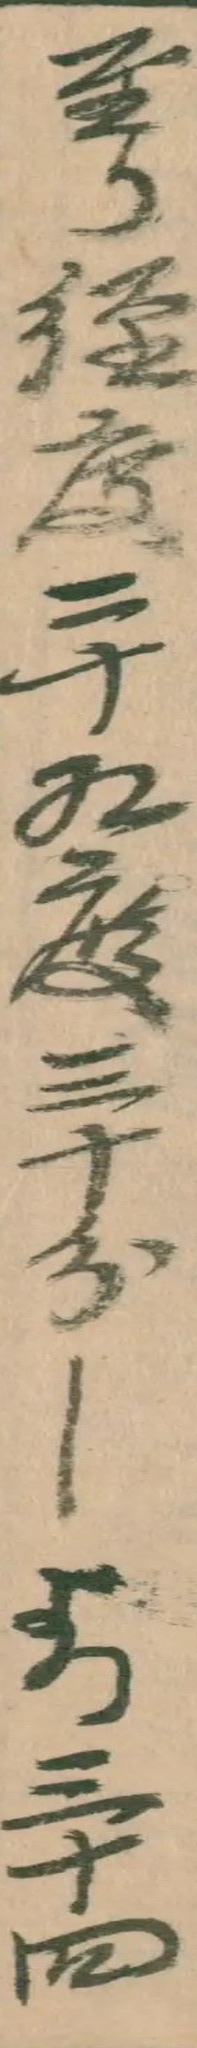至り経度二十五度三十分―より三十四
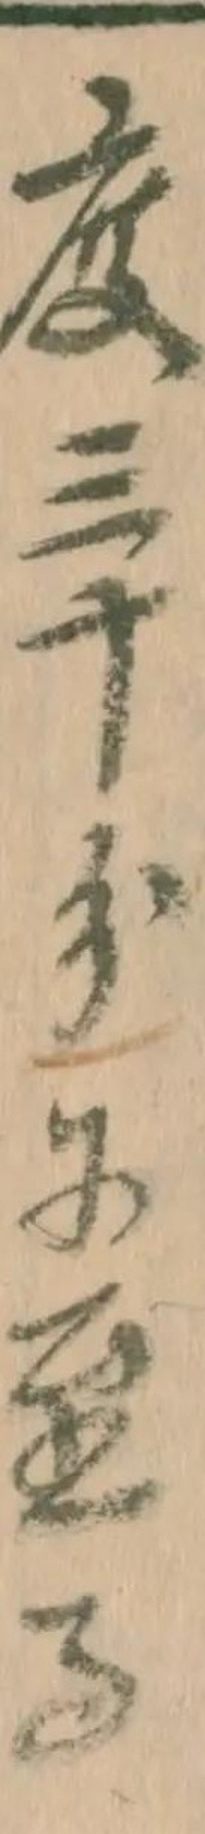度三十分に至る
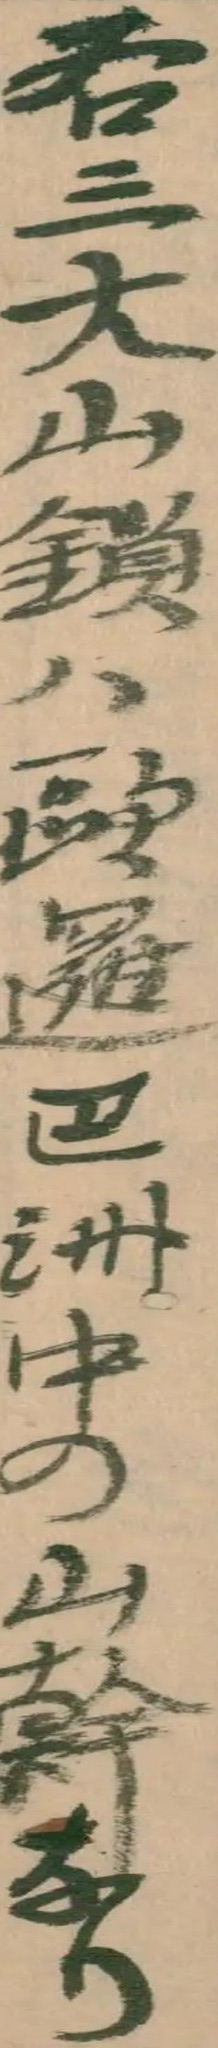各三大山鎖は欧邏巴洲中の山幹なり
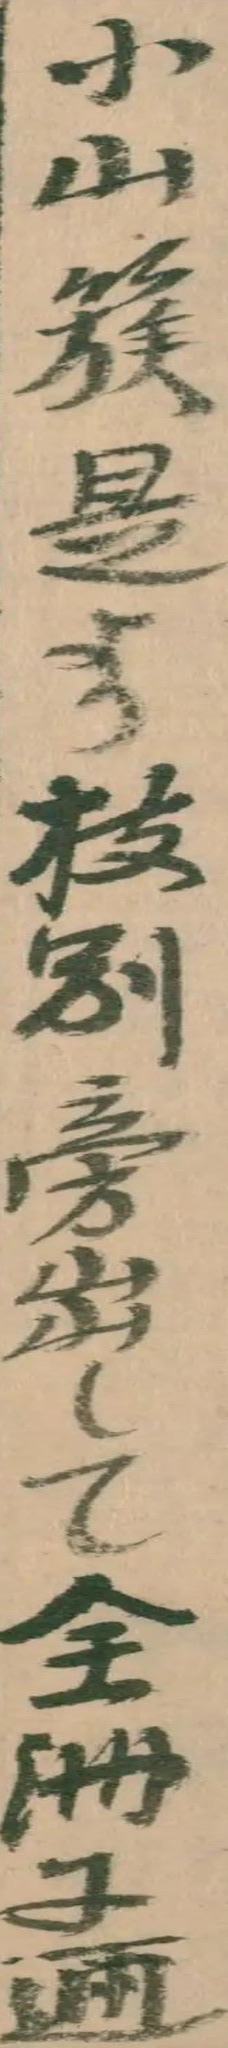小山簇是より枝別旁出して全洲に邇
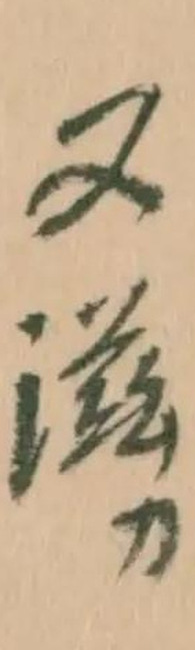又滋カ
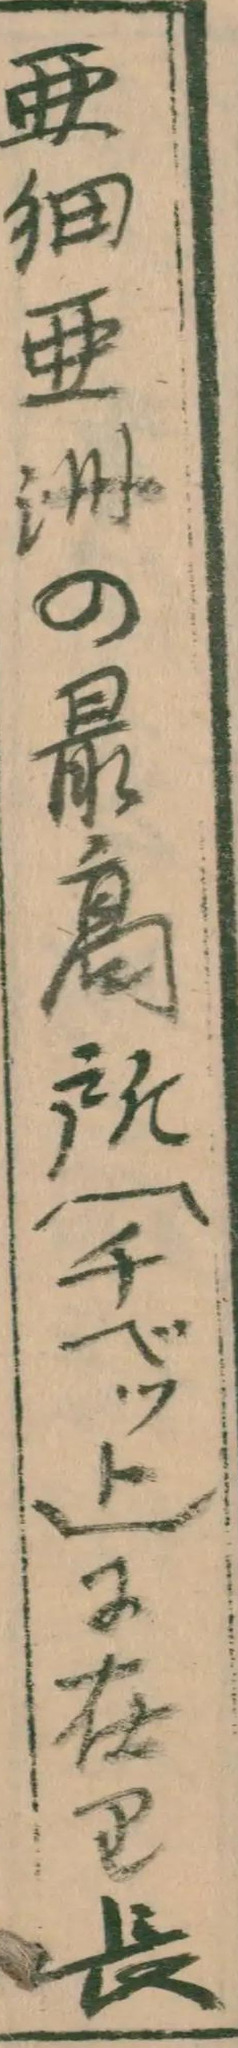亜細亜洲の最高所(チベット)に在り長
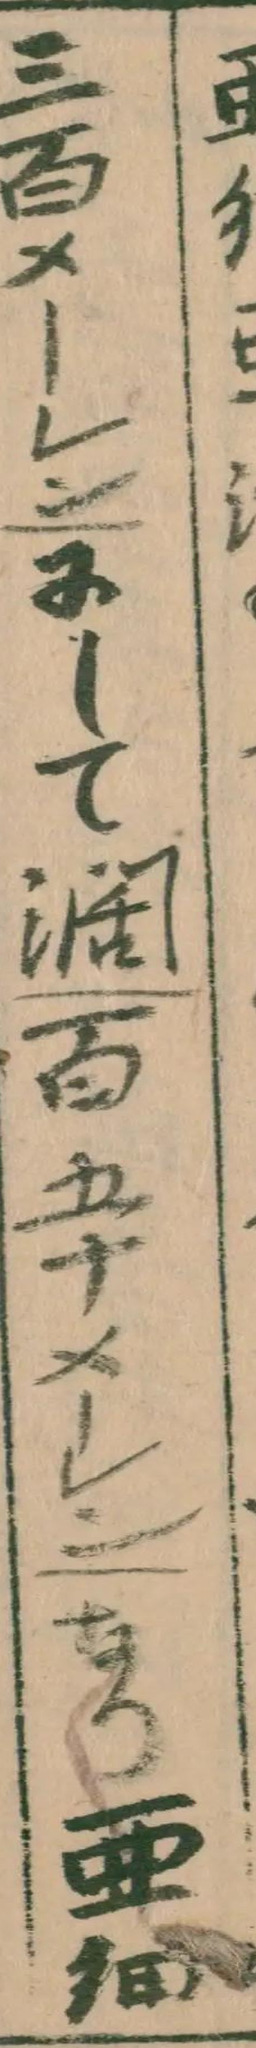三百メーレンにして濶百五十メーレンなり亜細
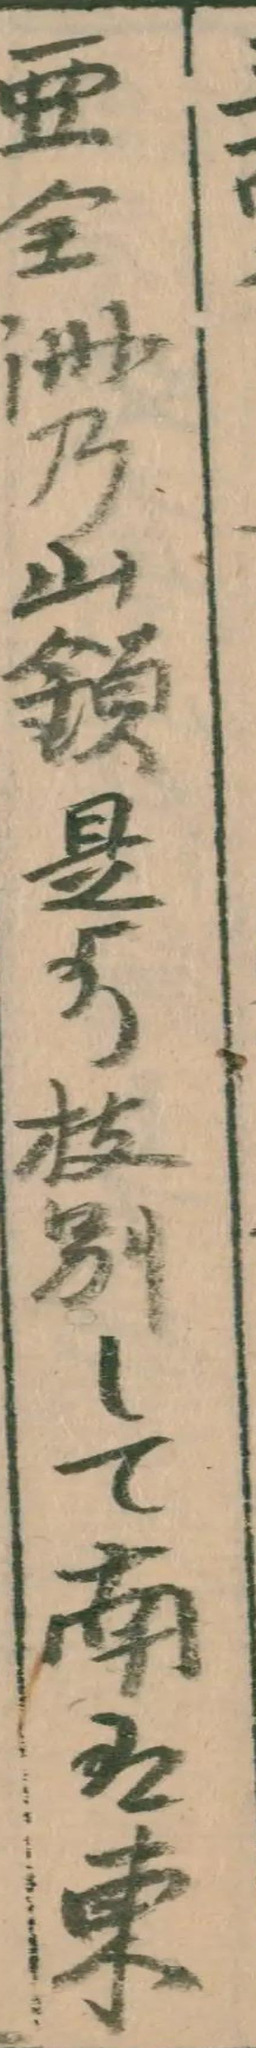亜全洲の山鎖是より枝別して南は東
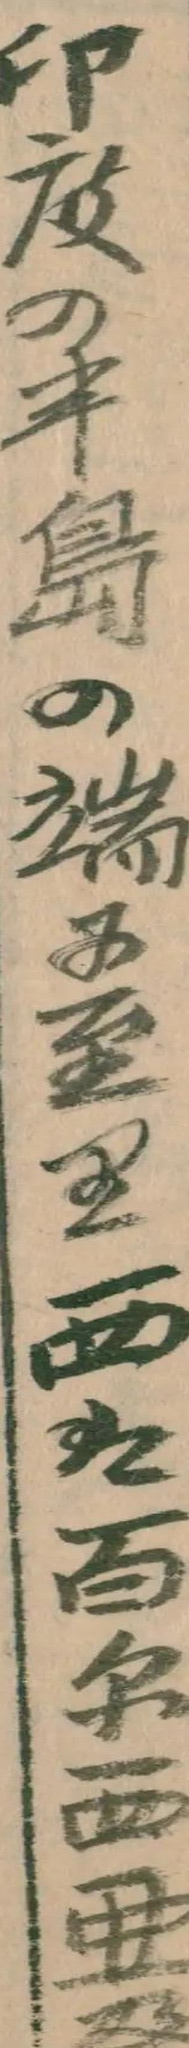印度の半島の端に至り西は百尓西亜及
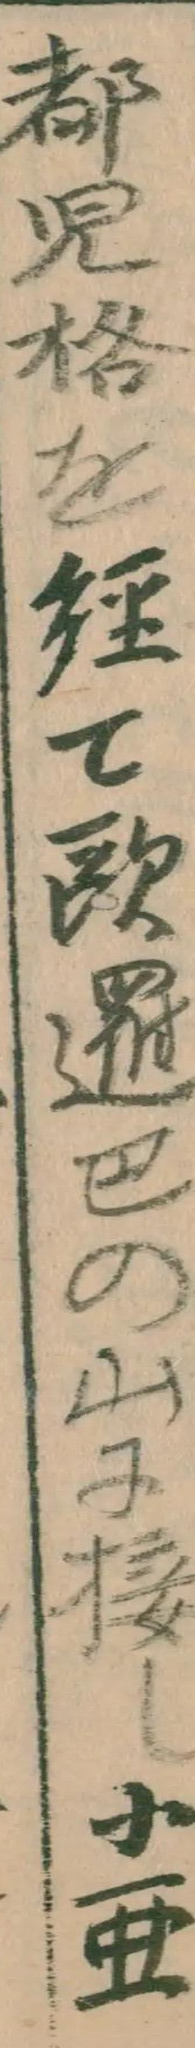都児格を経て欧邏巴の山に接し小亜
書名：新釈輿地図説
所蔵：国立国会図書館 National Diet Library, JAPAN
